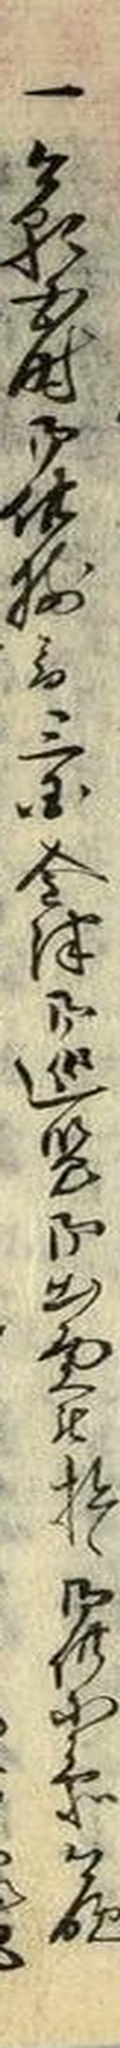一今朝五時御供揃ニ而三国金津御巡覧御出殿被遊候御供小兵衛今晩
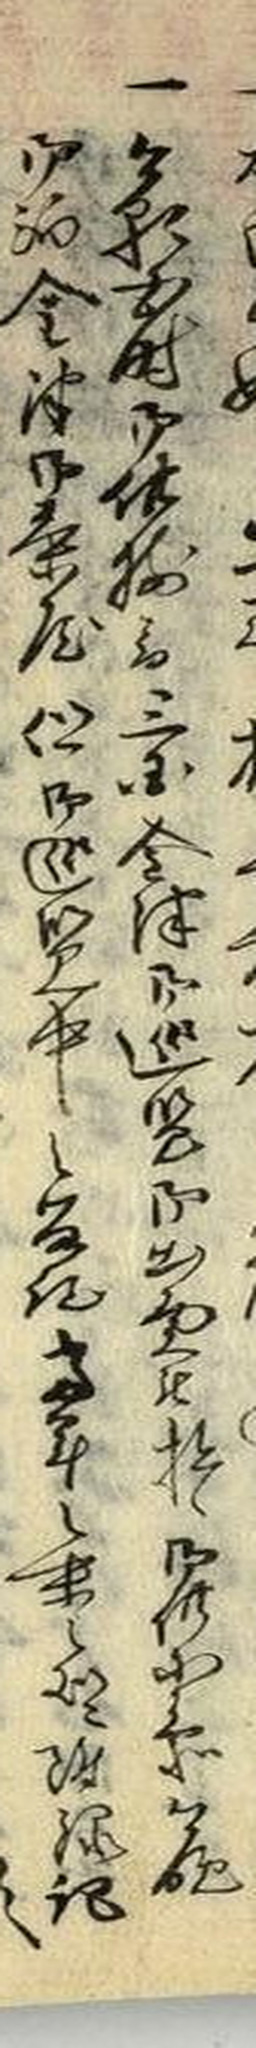御泊金津御茶屋但御巡覧中之留記当年之末之処ニ附録記之
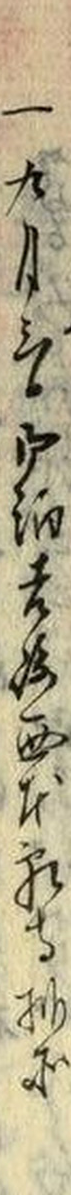一九月三日御泊吉崎西本願寺掛所
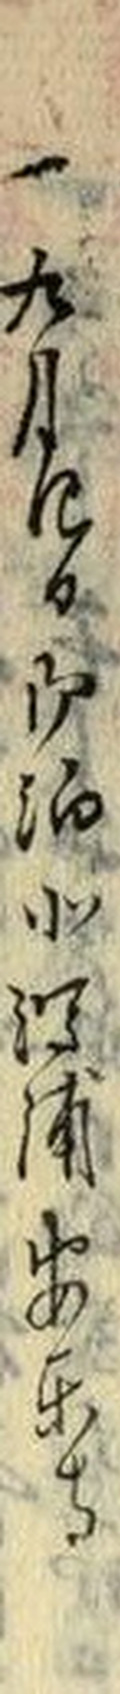一九月四日御泊北潟浦安楽寺
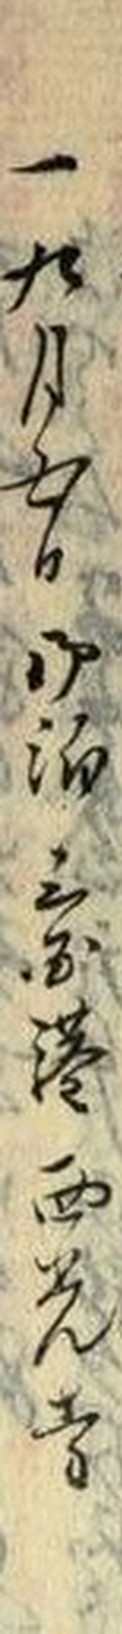一九月五日御泊三国湊西光寺
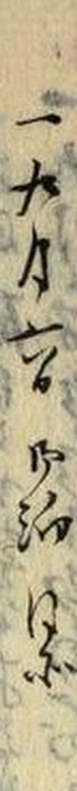一九月六日御泊同所
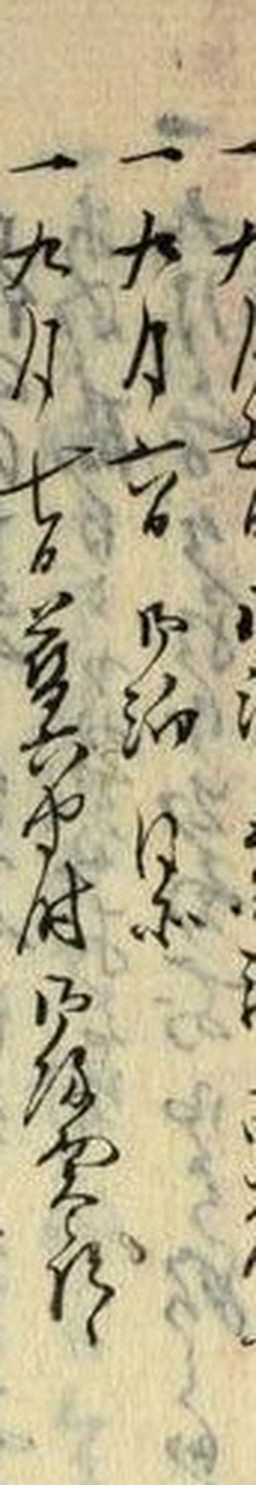一九月七日暮六半時御帰殿被遊候
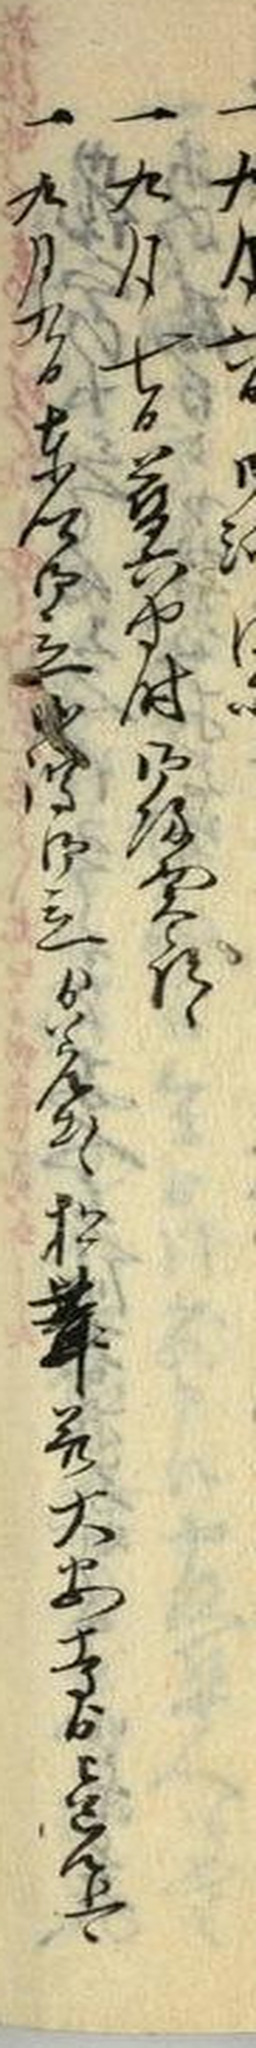一九月九日東郷御立北潟御立ゟ差出候松茸幷大安寺ゟ被差上候
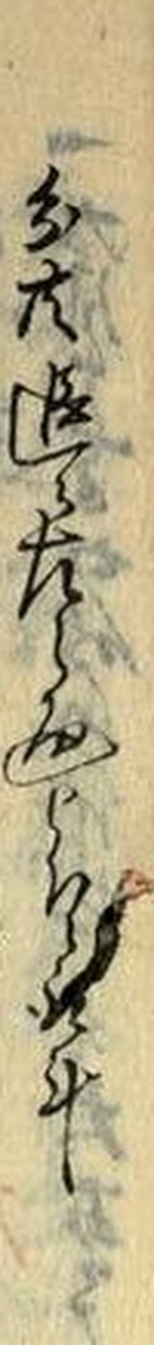分共追々左之通被下ニ取計
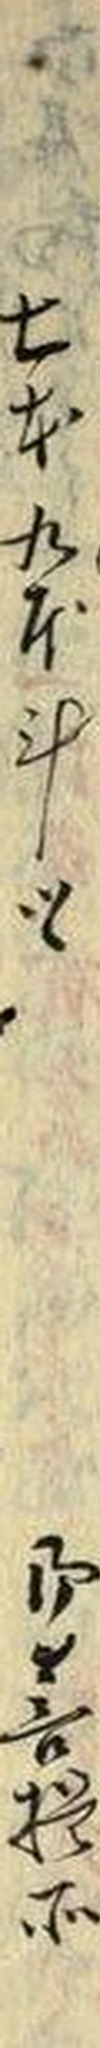七本九本斗ツヽ御菩提所
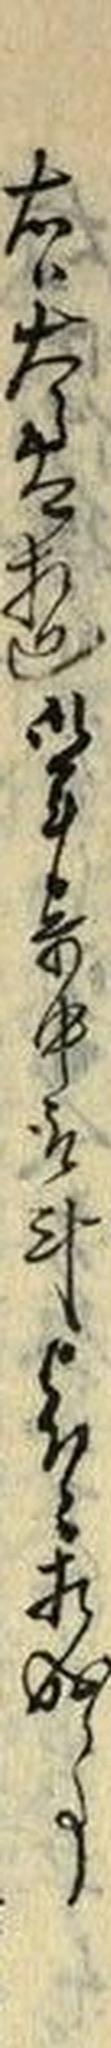右ハ大奥へ相廻御年寄中取計被下ニ相成候事
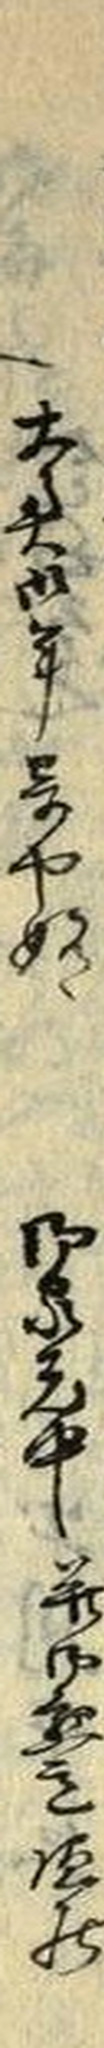大奥御年寄中始へ御家老中幷御懇意隠居
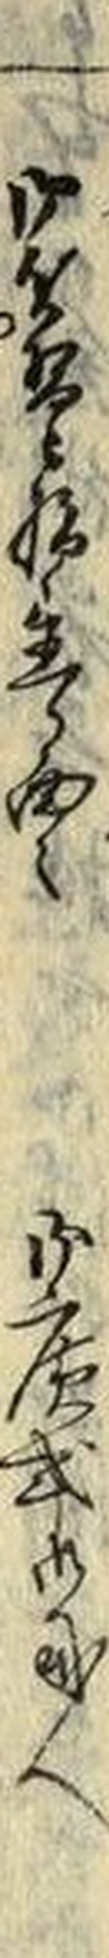御近習被指置候面々御広式御用人
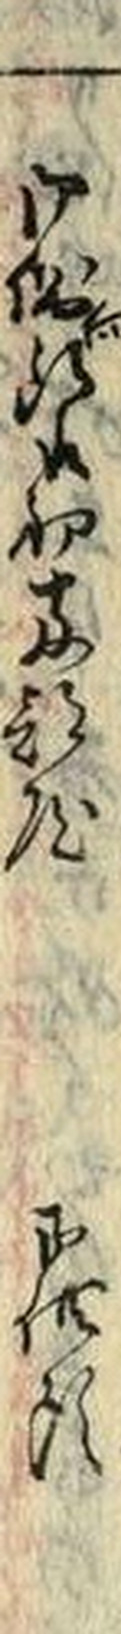御側向頭取初両部屋御供頭
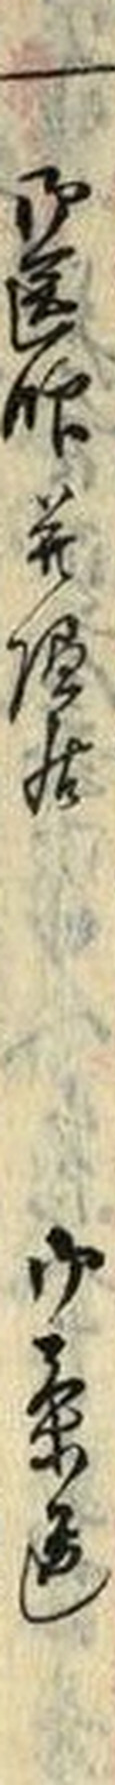御医師幷隠居御茶道
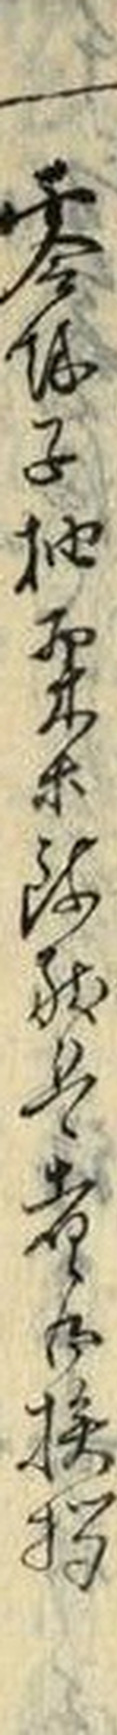零余子柚栗等致献上候者へ御挨拶
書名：少傅日録抄（斉承付側向頭取日記、在国）
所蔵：福井県文書館 Fukui Prefectural Archives
